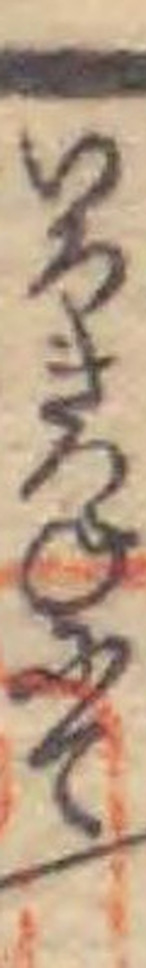いろきつねにて
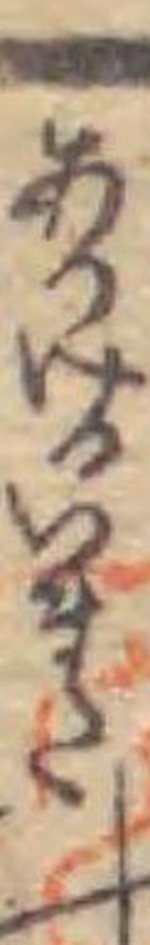ありけるいまた
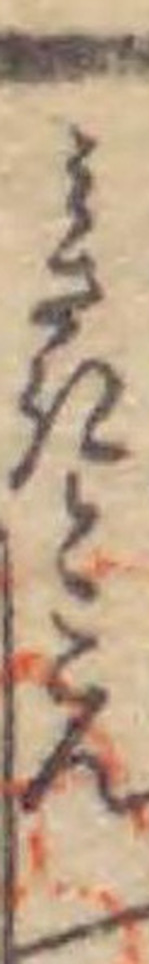みさきとこん
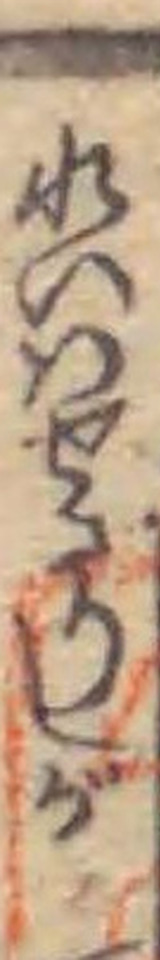れいはせさりしが
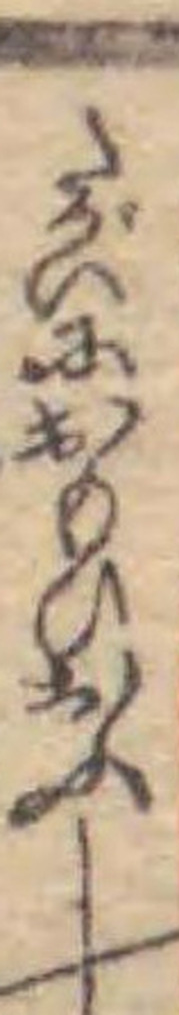たがいにおもひおふ
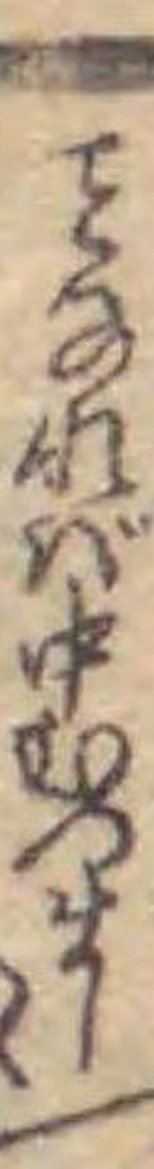ことなれば中むつましく
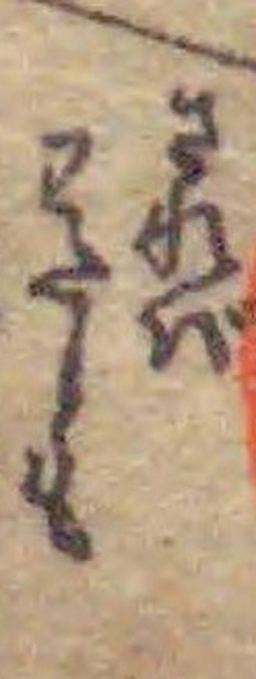わたしも
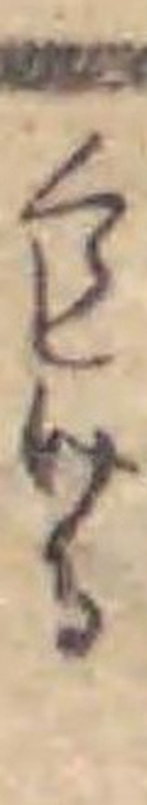くらしける
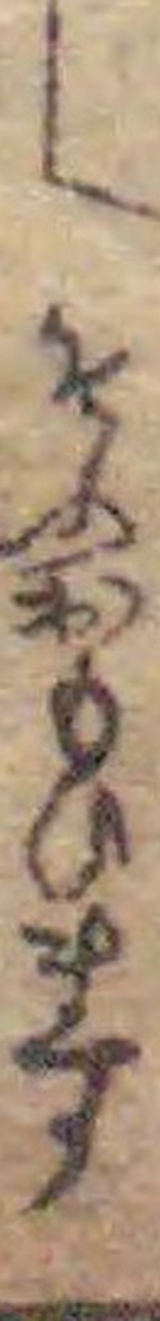そふおもひます
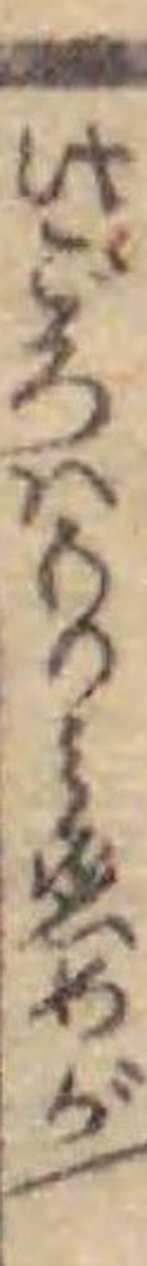此ごろはもりの丞めが
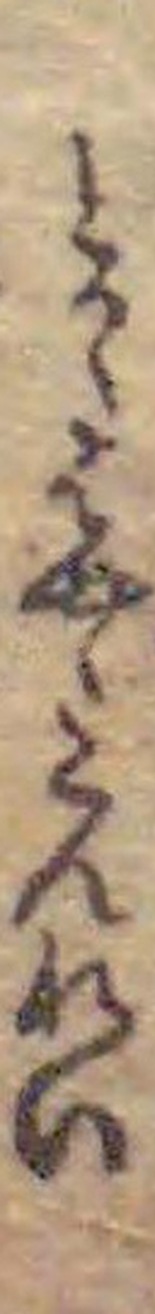とかくはやくこんれい
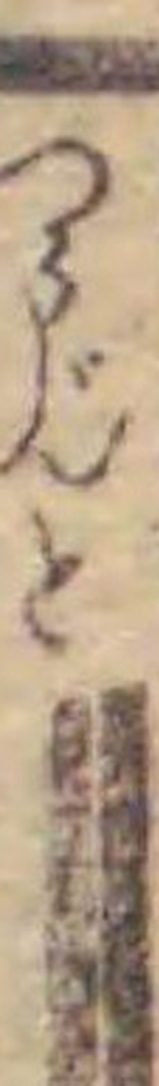つうじんと
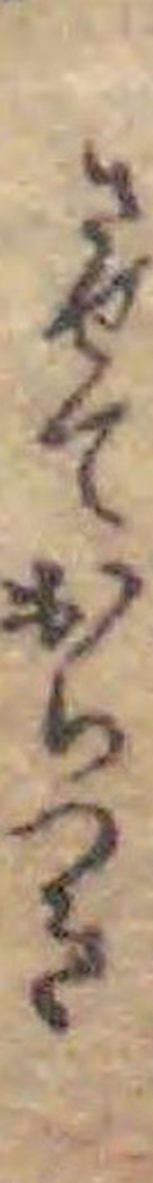させておちつき
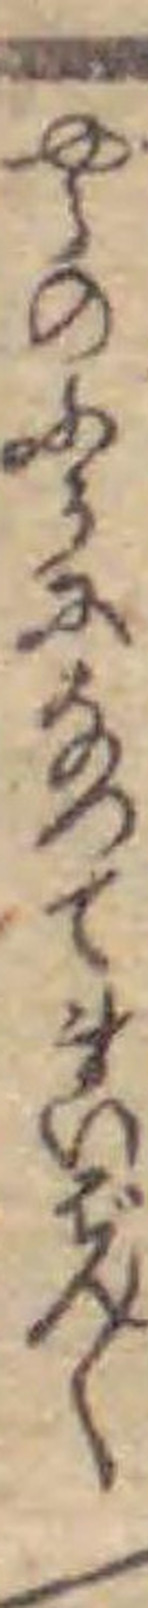やらのふうになつてまいばん〳〵
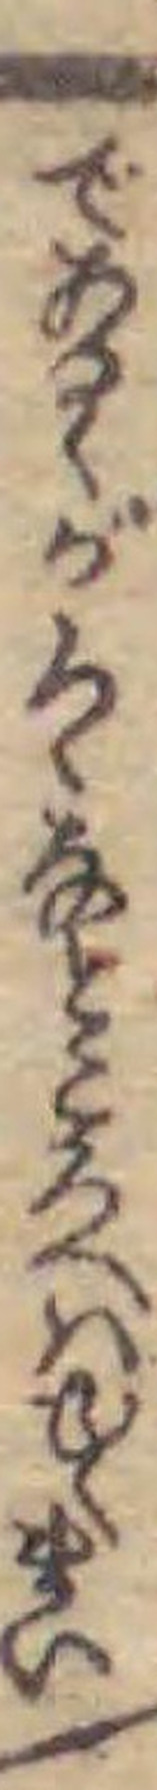であるくがろくなところへはゆくまい
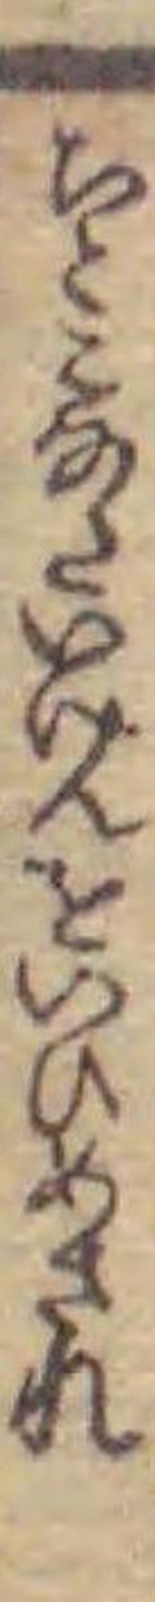ちとこなたいけんをいひめされ
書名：扨化狐通人 : 2巻
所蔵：国立国会図書館 National Diet Library, JAPAN
